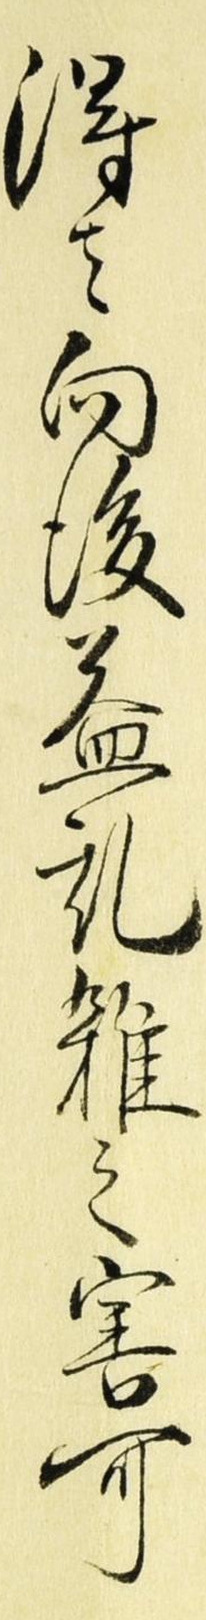得者向後益乱雑之害可
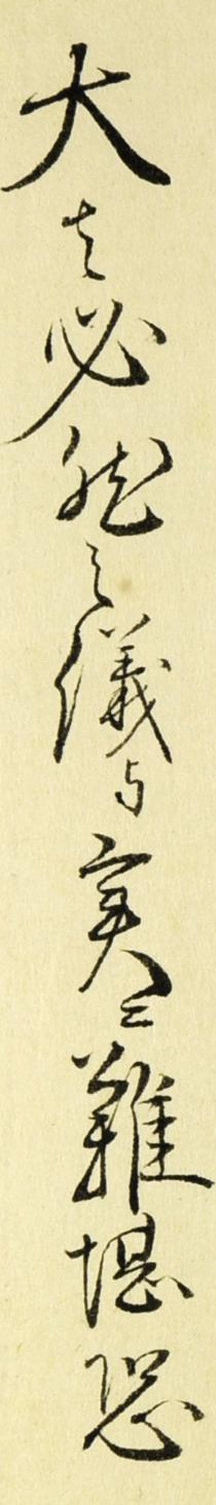大者必就之儀与実ニ難堪恐
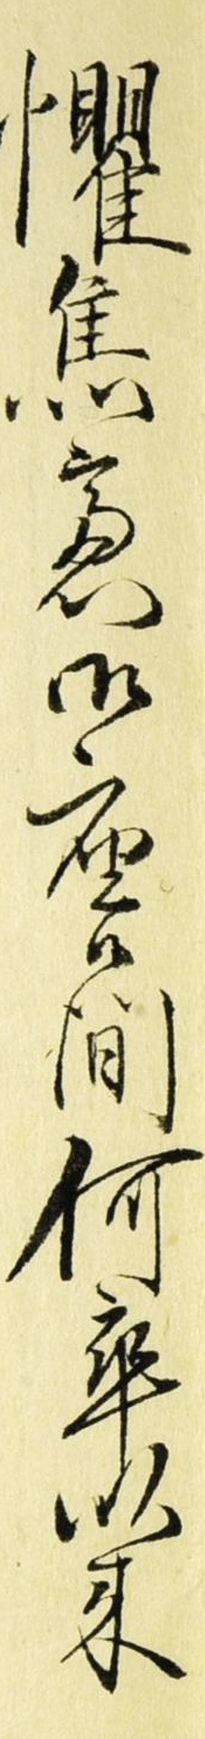懼焦慮御座候間何卒以来
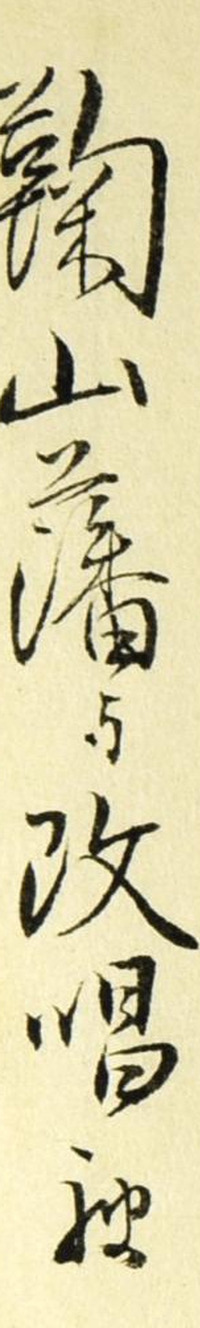鞠山藩与改唱被

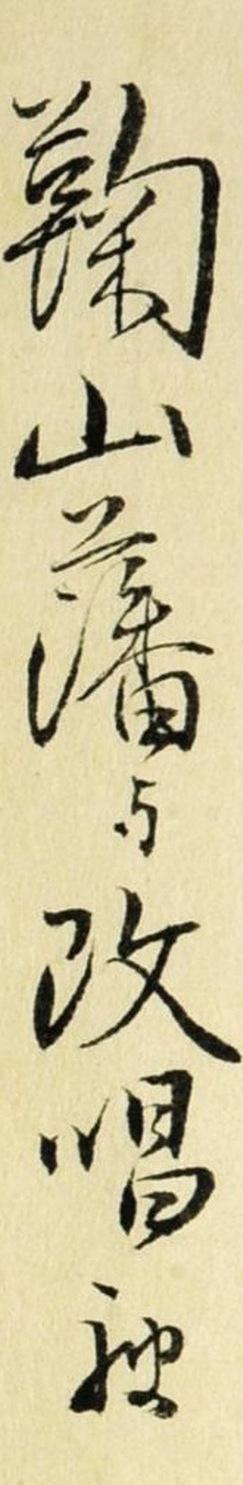鞠山藩与改唱被
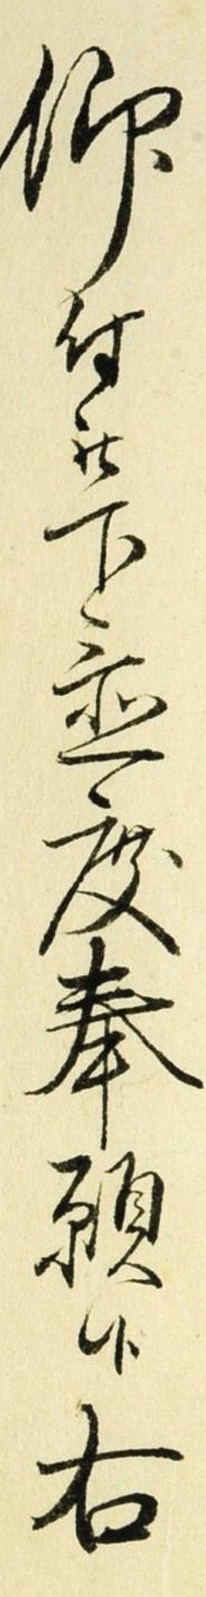仰付被下置度奉願候右
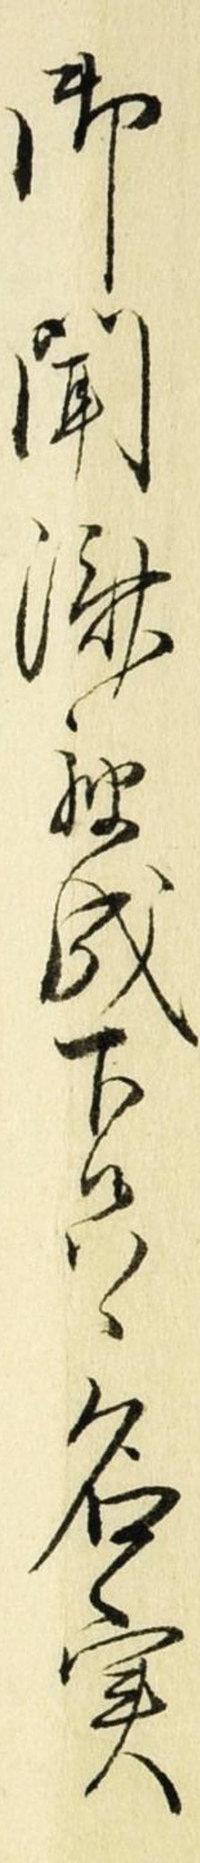御聞済被成下候ハヽ名実
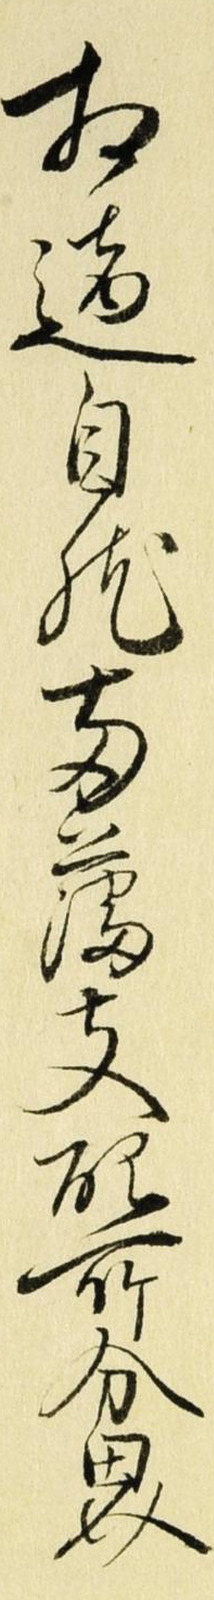相辺自然両藩支配所分界
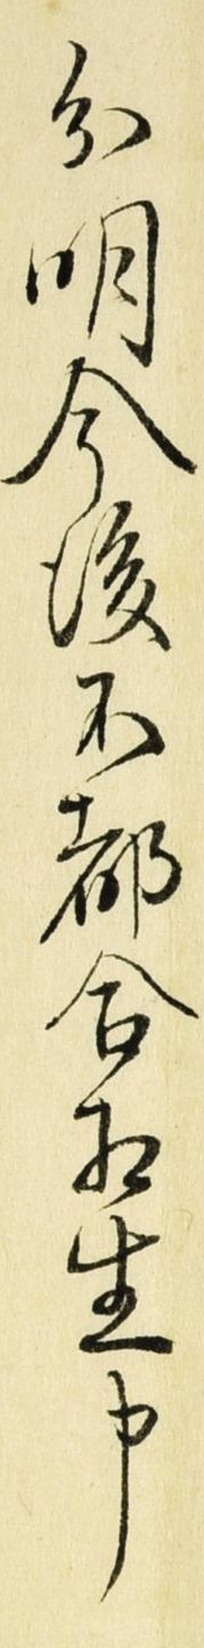分明今後不都合相生申
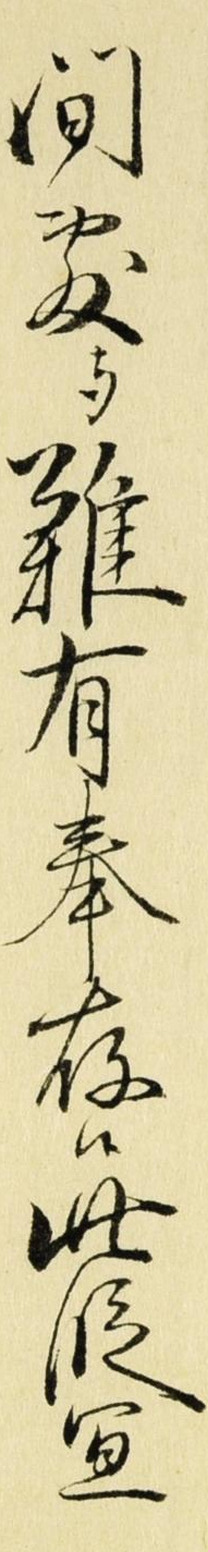間敷与難有奉存候此後宜
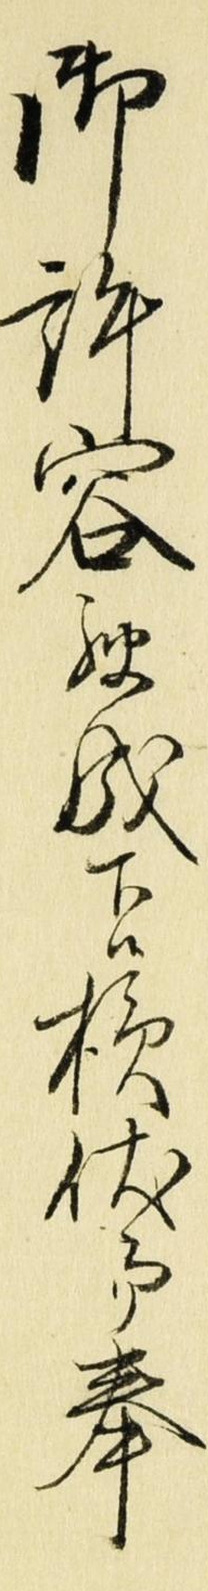御許容被成下候様伏手而奉
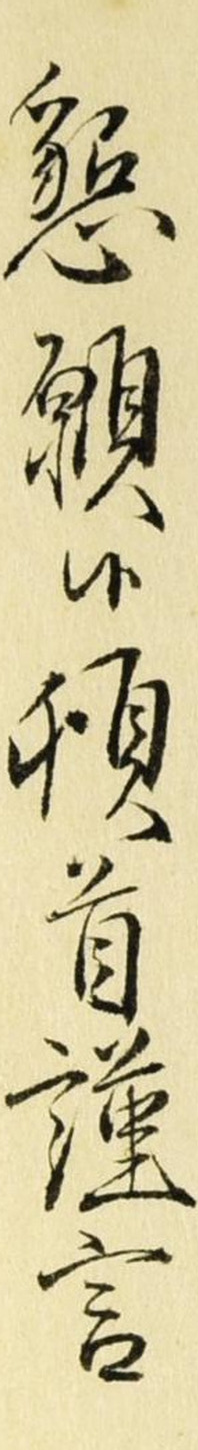懇願候頓首謹言
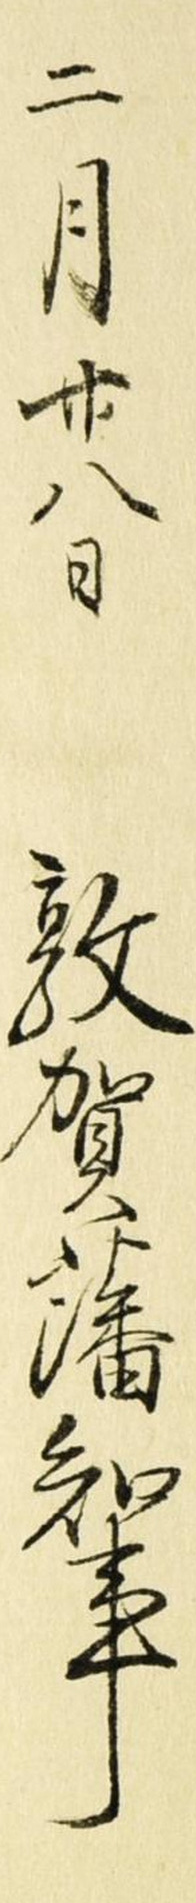二月廿八日敦賀藩知事
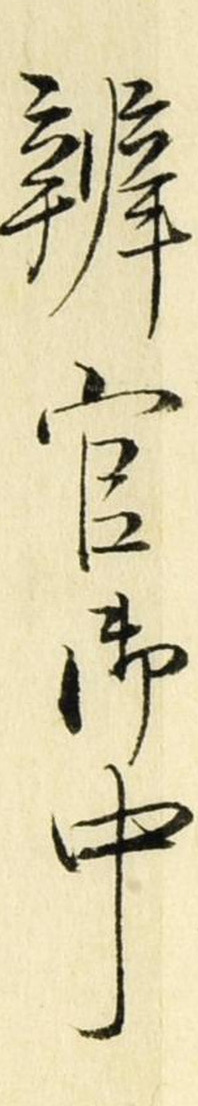弁官御中
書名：敦賀藩名改称歎願書
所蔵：福井県立図書館
